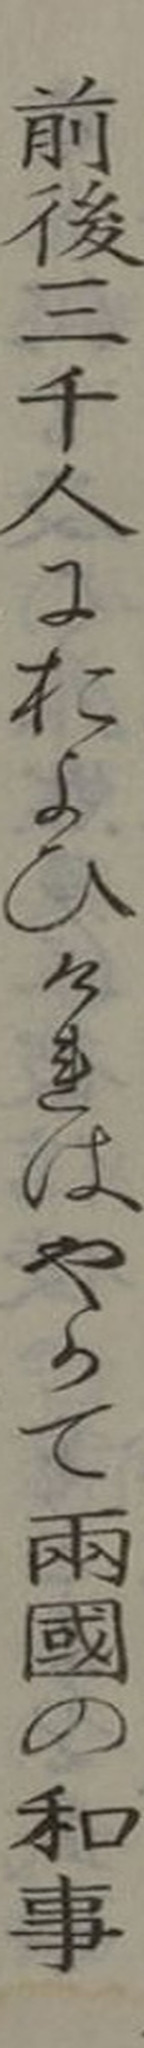前後三千人におよひけれはやかて兩國の和事
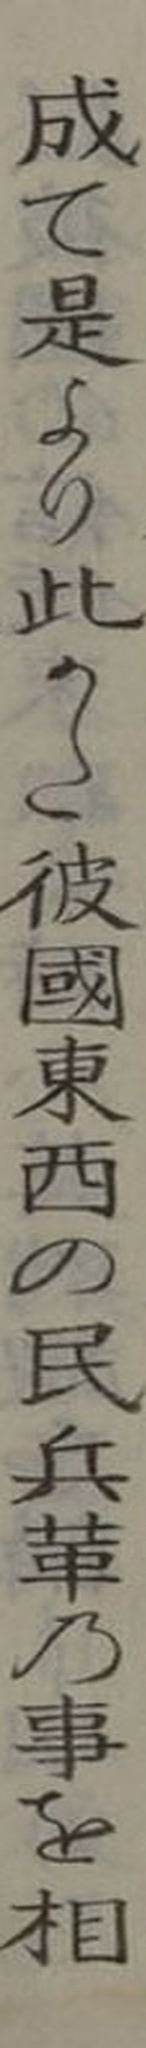成て是より此かた彼國東西の民兵革の事を相
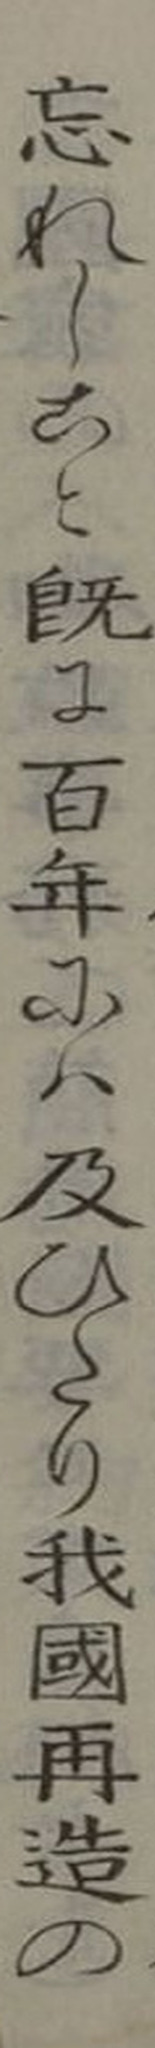忘れしこと既に百年には及ひたり我國再造の
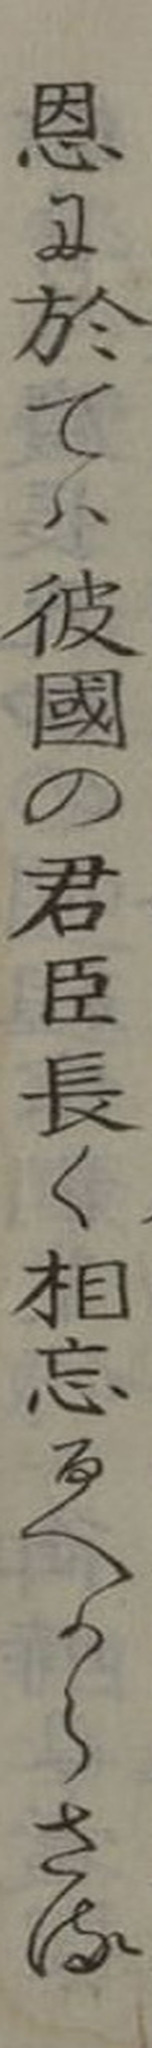恩に於ては彼國の君臣長く相忘るへからさる

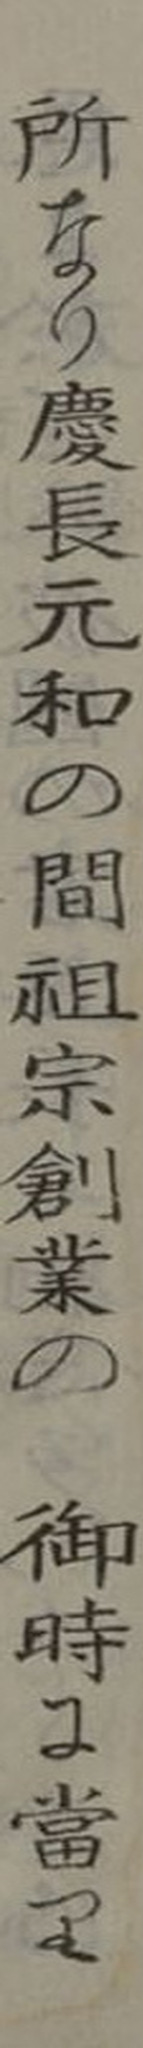所なり慶長元和の間祖宗創業の御時に當り
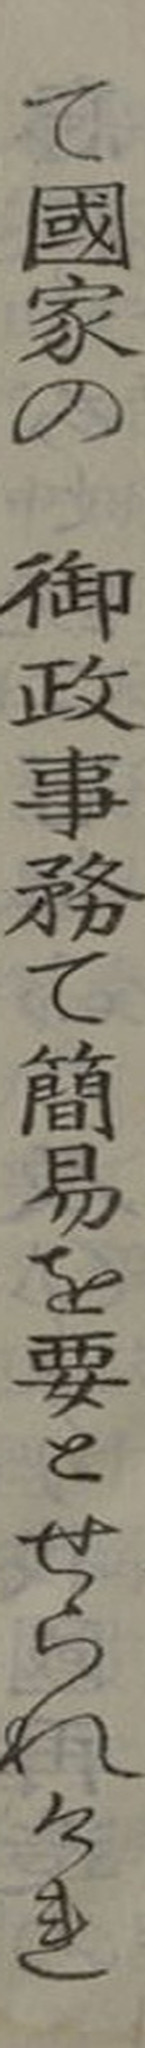て國家の御政事務て簡易を要とせられけれ
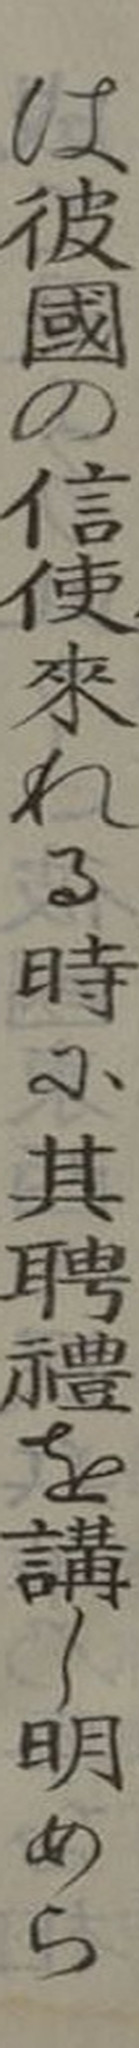は彼國の信使來れる時に其聘禮を講し明めら
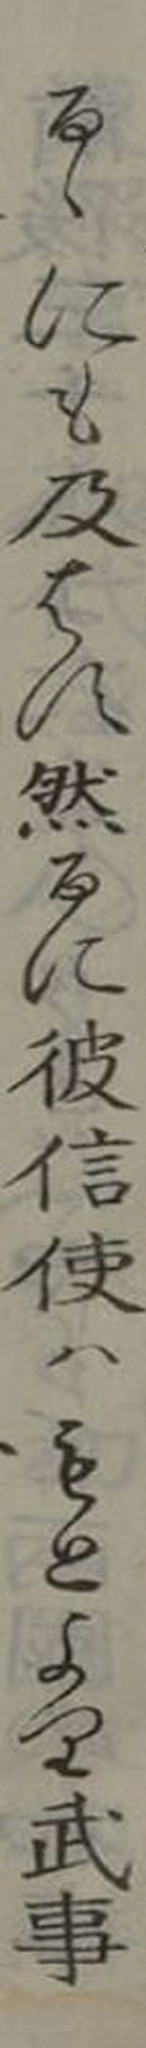るゝにも及はす然るに彼信使はもとより武事
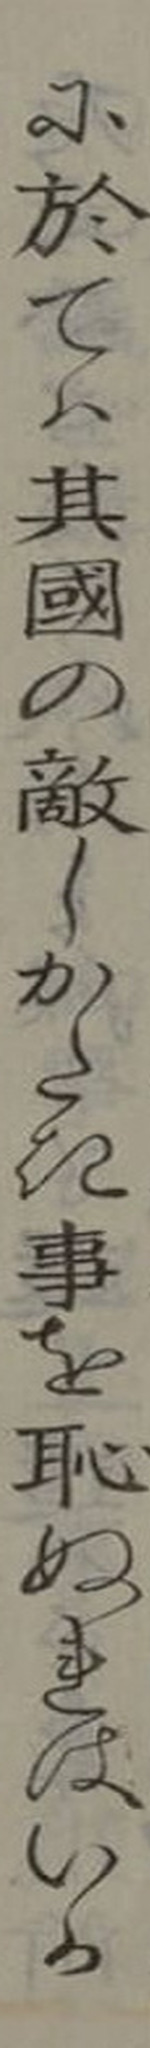に於ては其國の敵しかたき事を恥ぬれはいか
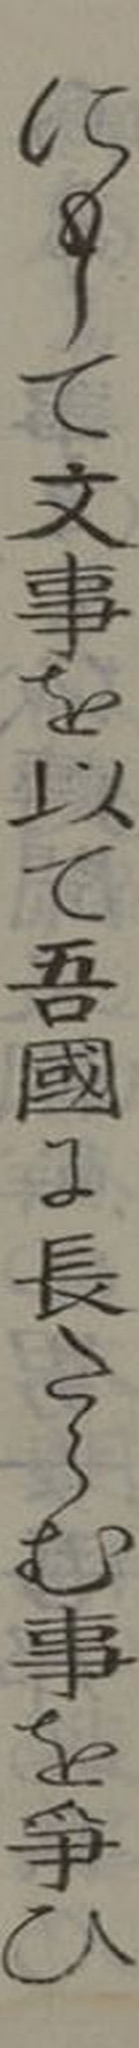にもして文事を以て吾國に長たらむ事を爭ひ
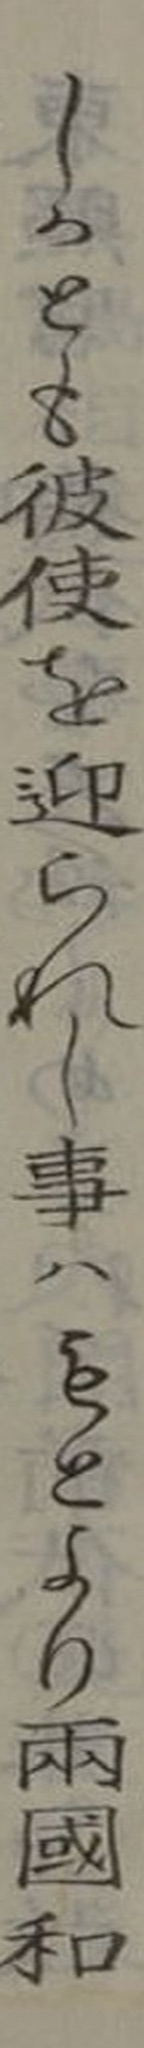しかとも彼使を迎られし事はもとより兩國和
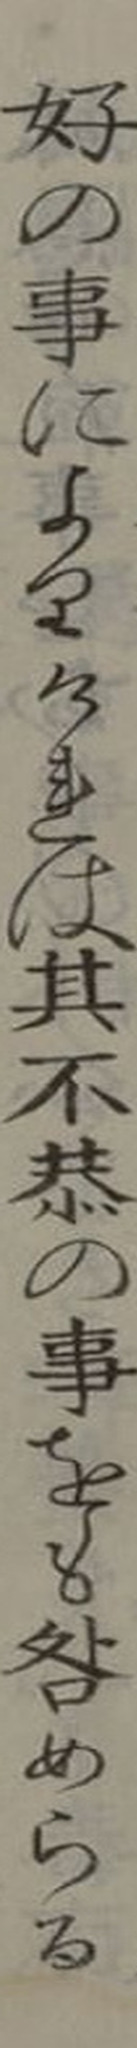好の事によりけれは其不恭の事をも咎めらる
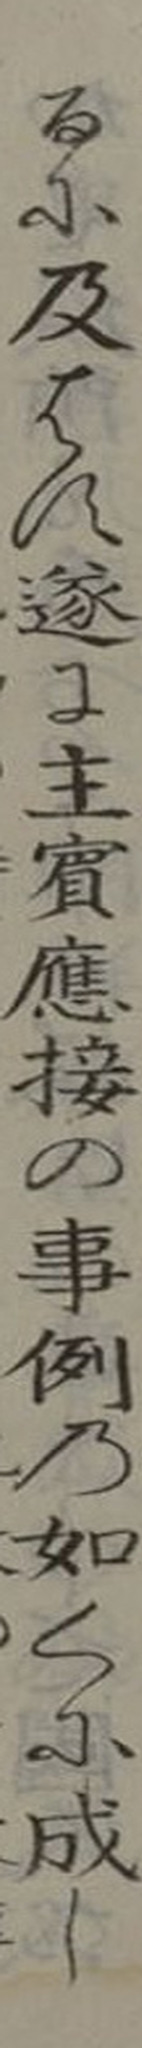るに及はす逐に主賓應接の事例の如くに成し
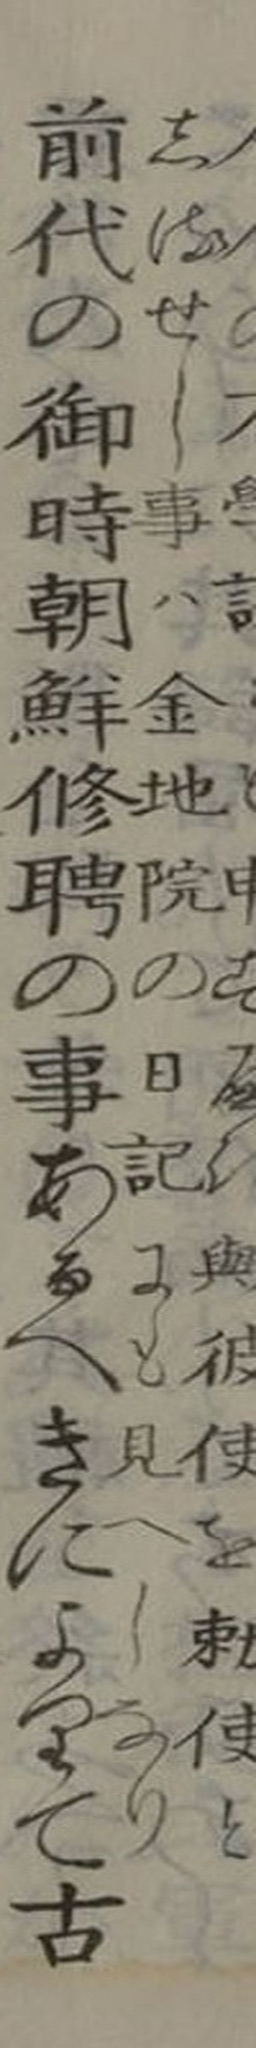前代の御時朝鮮修聘の事あるへきによりて古
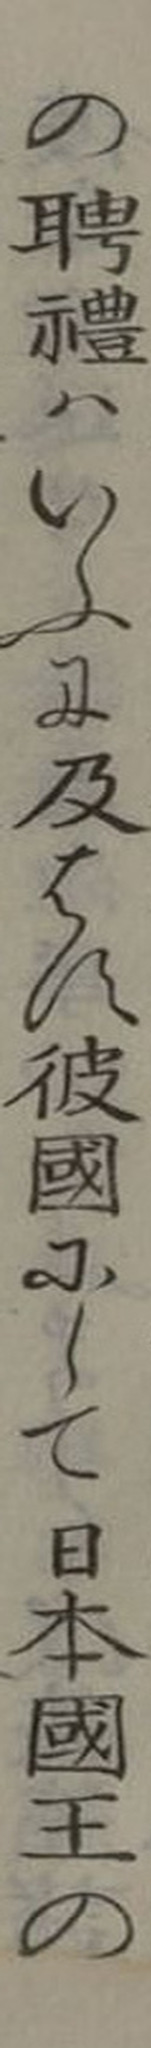の聘禮はいふに及はす彼國にして日本國王の
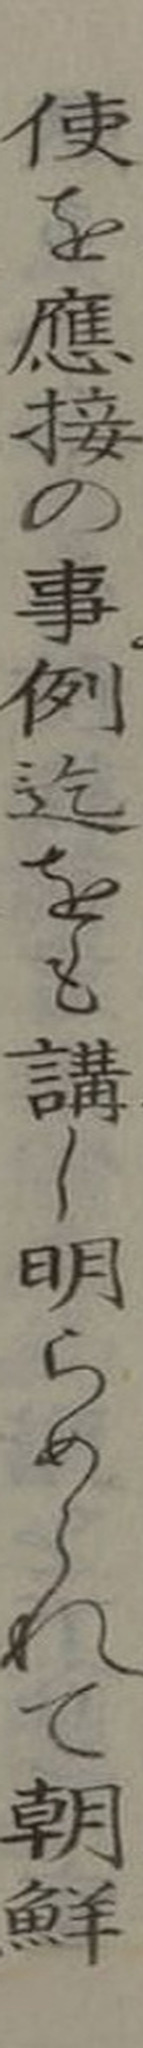使を應接の事例迄をも講し明らめられて朝鮮
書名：骨董録
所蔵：University of the Ryukyus Library
